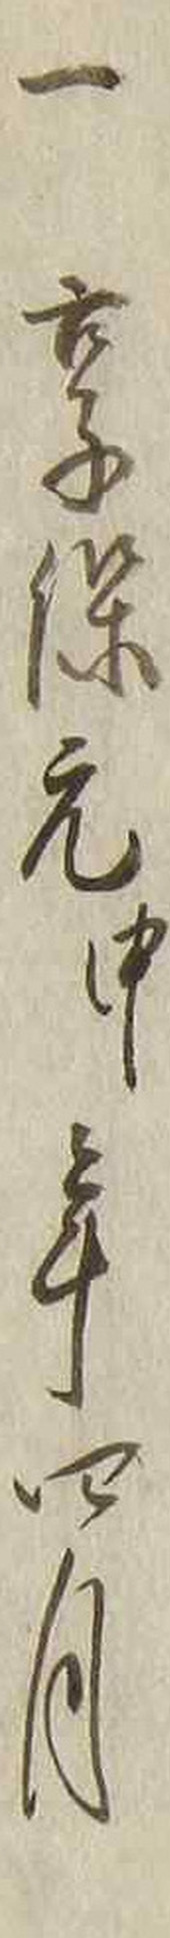一享保元申年四月

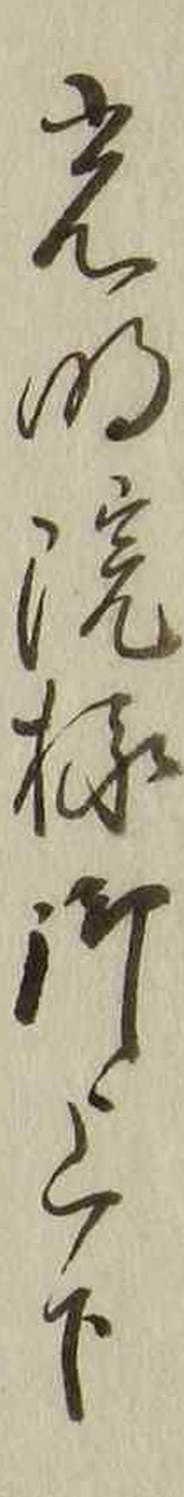光明院様御上下
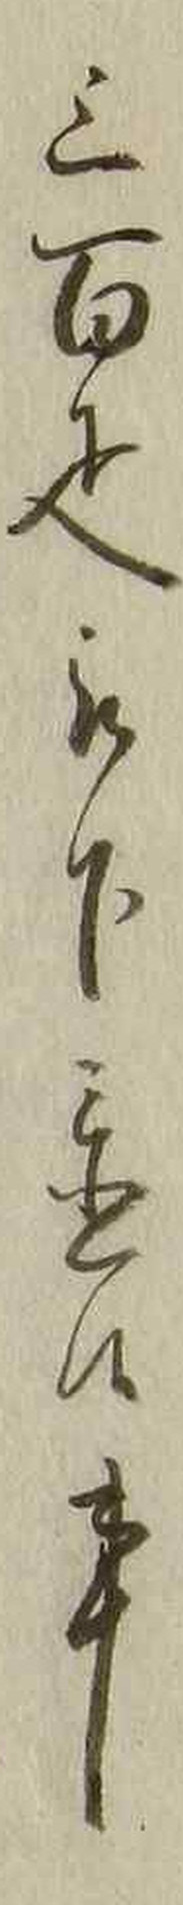三百疋被下置候事
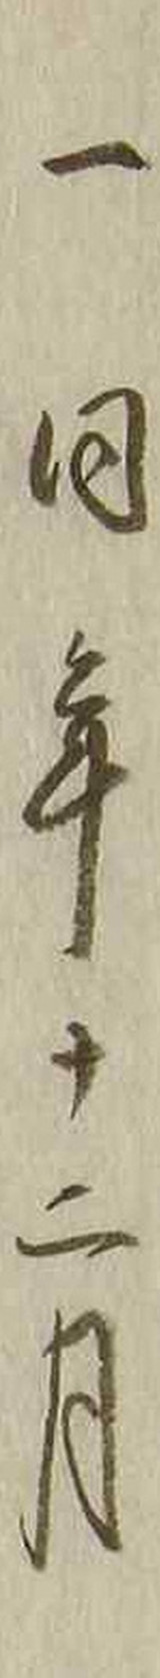一同年十二月
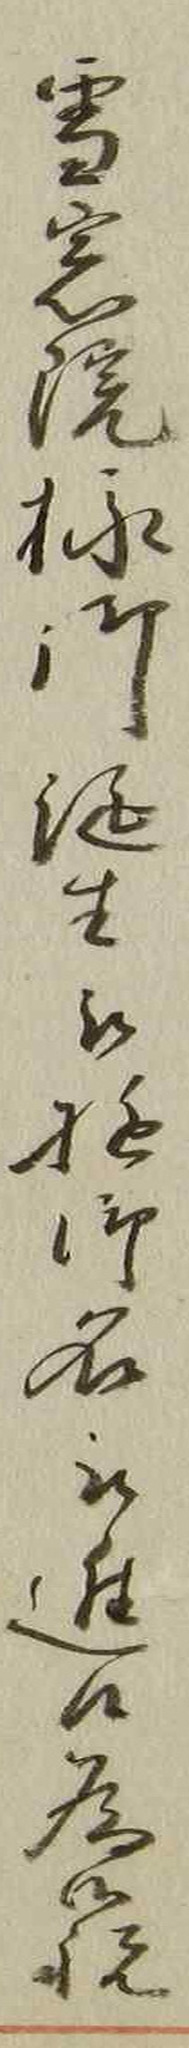雪窓院様誕生被遊御名被進候為御祝
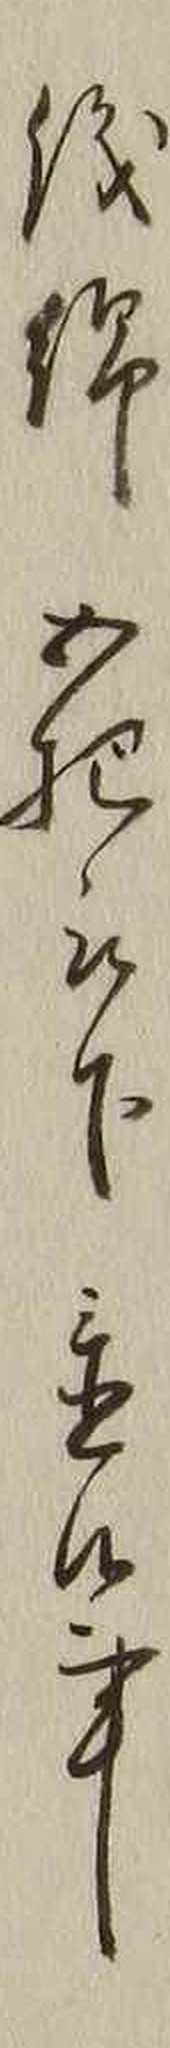儀綿五把被下置候事
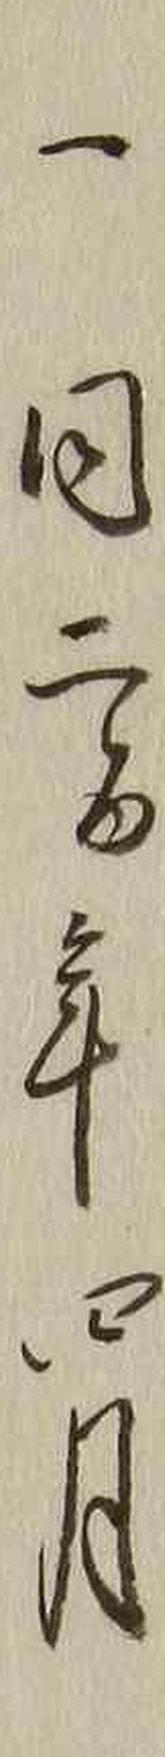一同二酉年四月
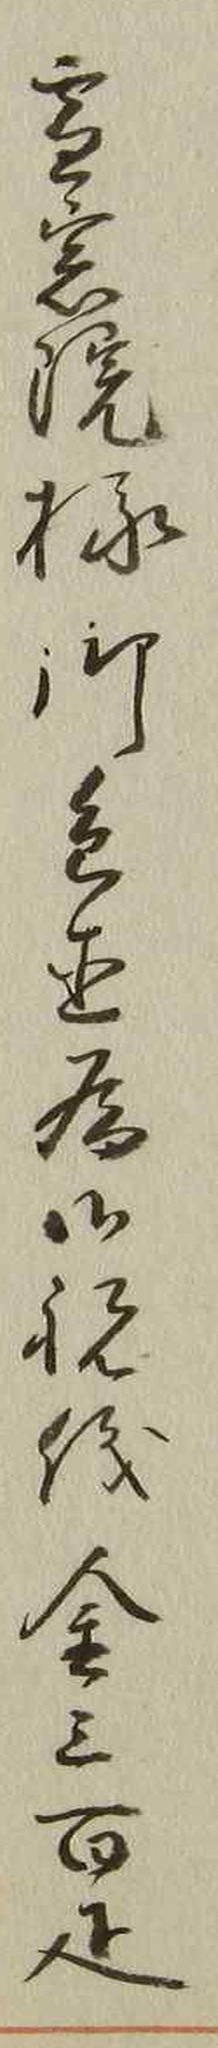雪窓院様御色直為御祝儀金三百疋
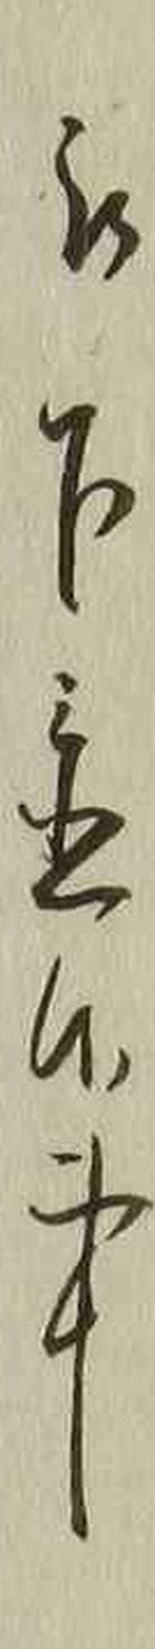被下置候事
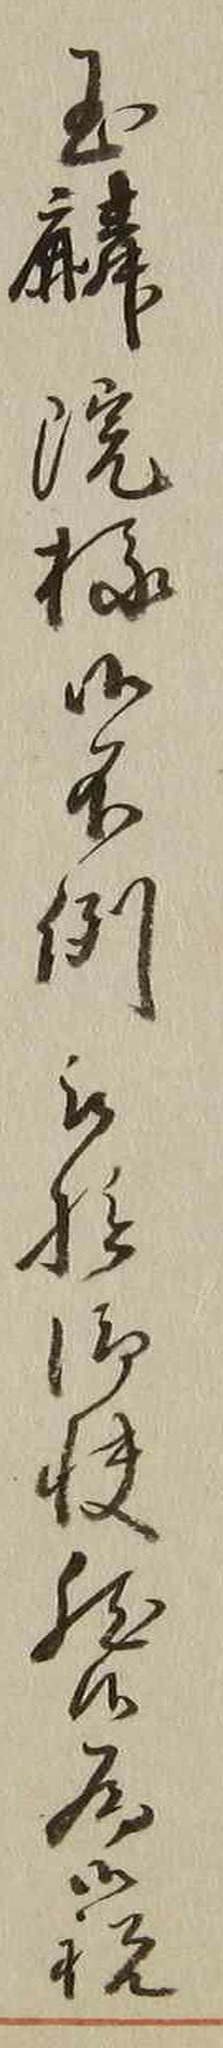玉麟院様御不例被遊御快然候為御祝
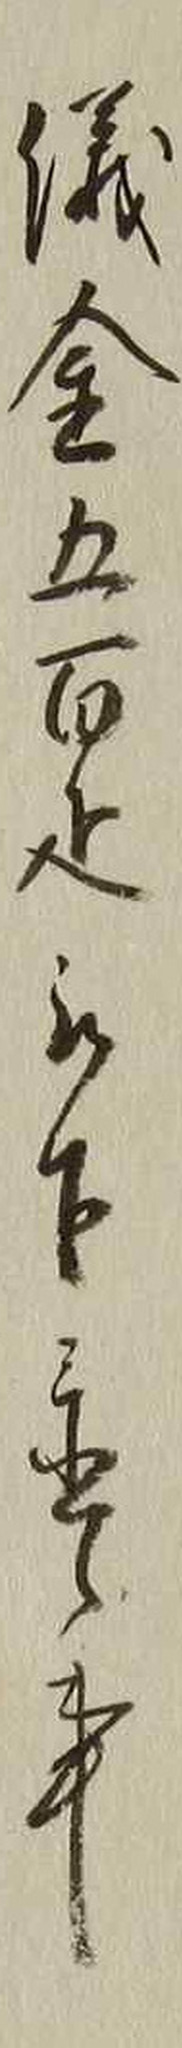儀金五百疋被下置候事
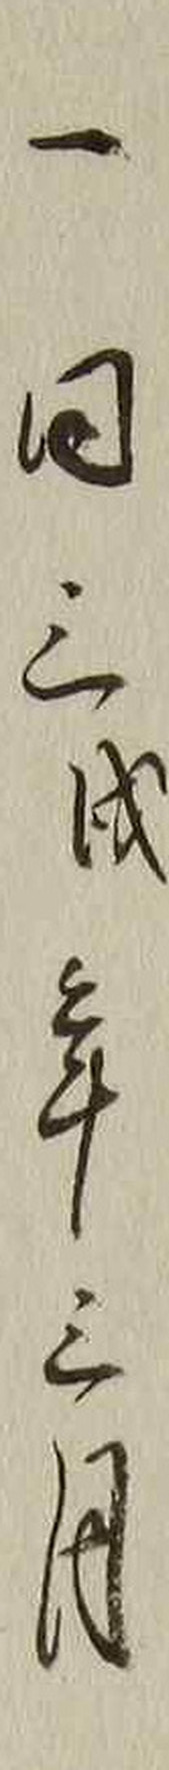一同三戌年三月
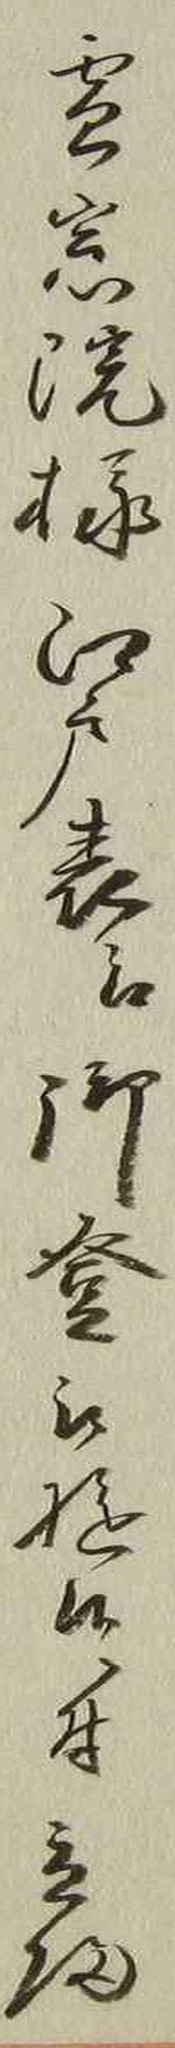雪窓洗様江戸表江御登被遊候ニ付立帰
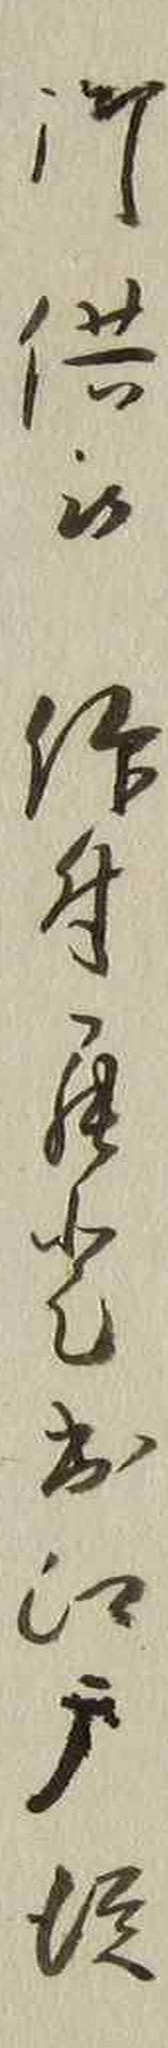御供被仰付罷登於江戸従
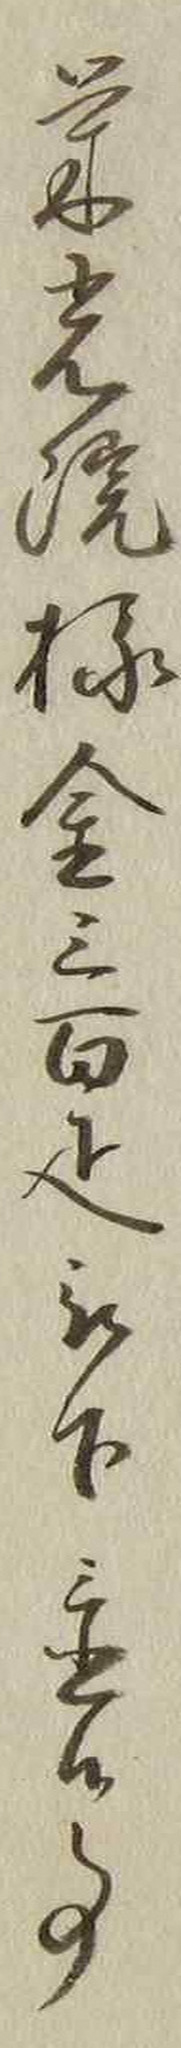栄光院様金三百疋被下置候事
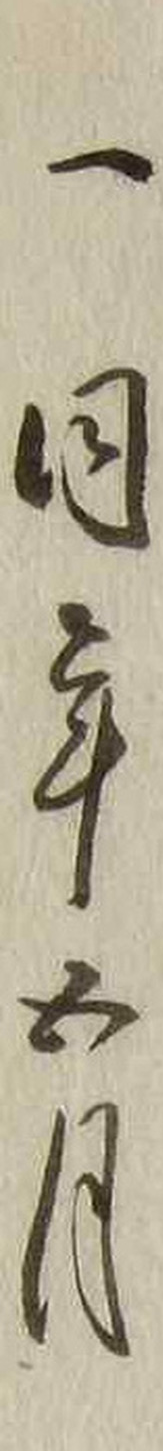一同年五月
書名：諸士系譜　巻之122　よ之部5
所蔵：会津若松市立会津図書館
